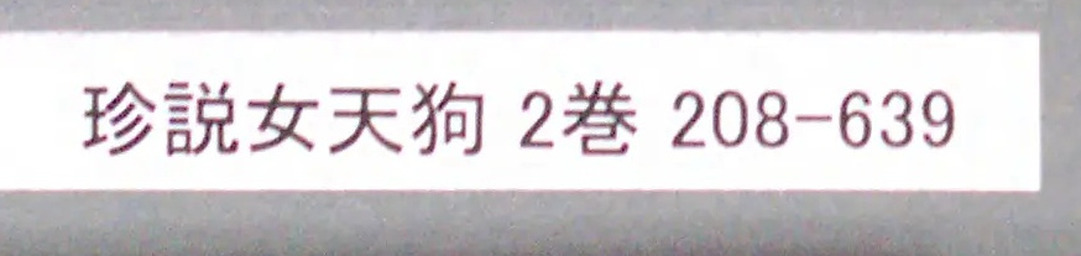珍説女天狗完

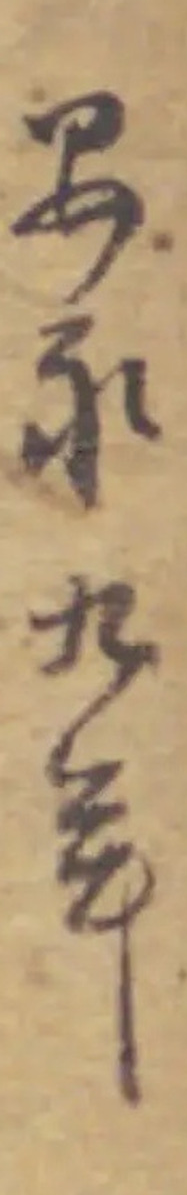安永九年

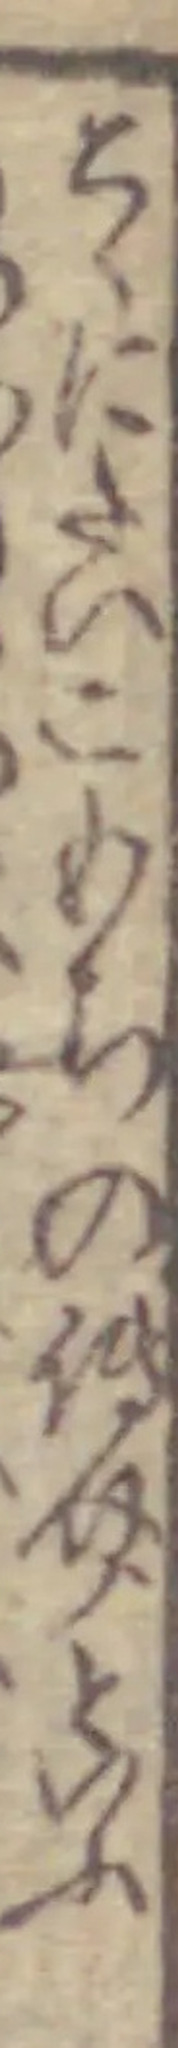こゝにたいこもちの伝介といふ
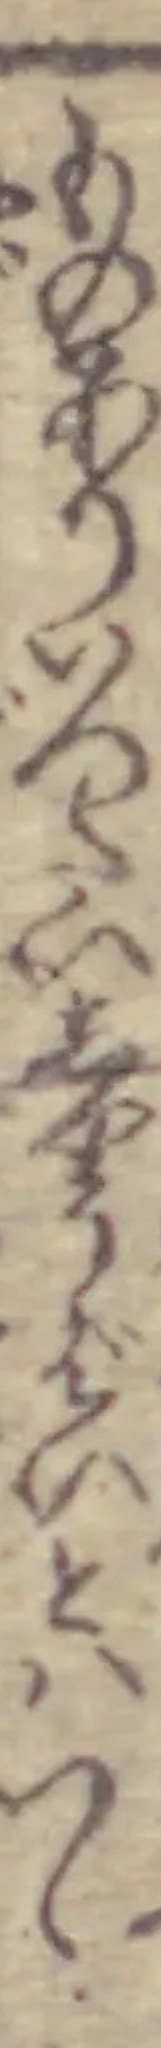ものありいつたいしやうばいとはいゝ
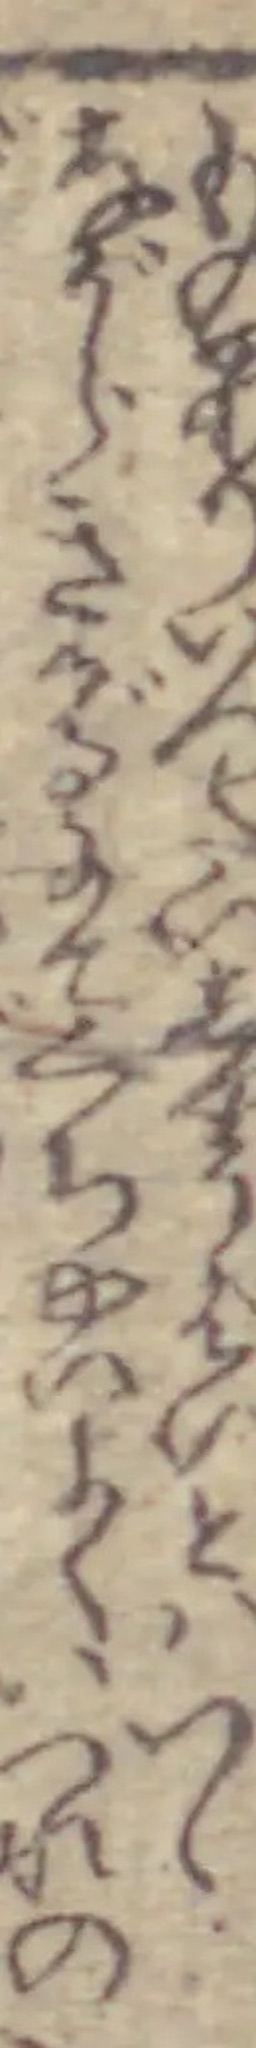ながらきがるにてくちやいよくいつれの
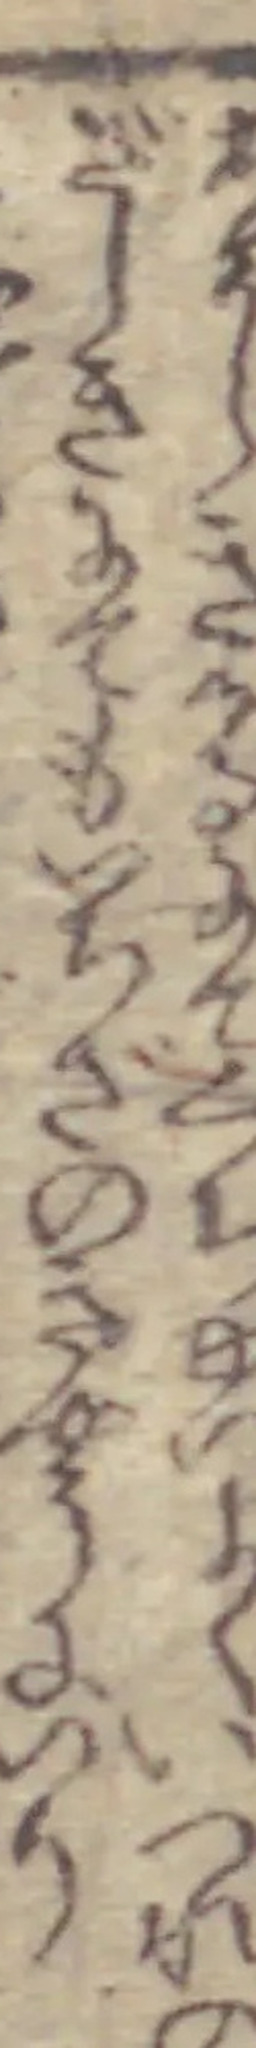ざしきにてもいちざのきやうにいり
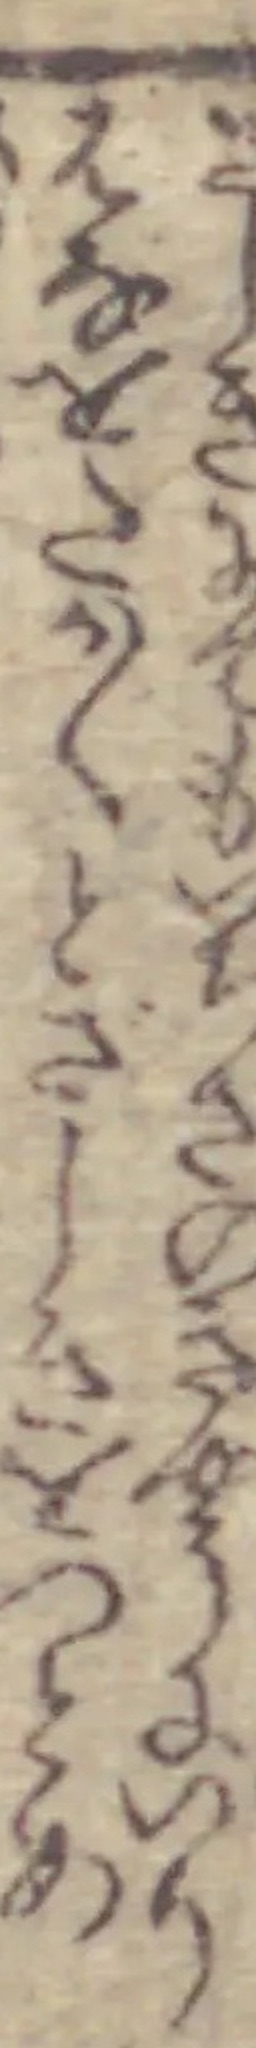はなをたか〳〵とざしきをつとめ
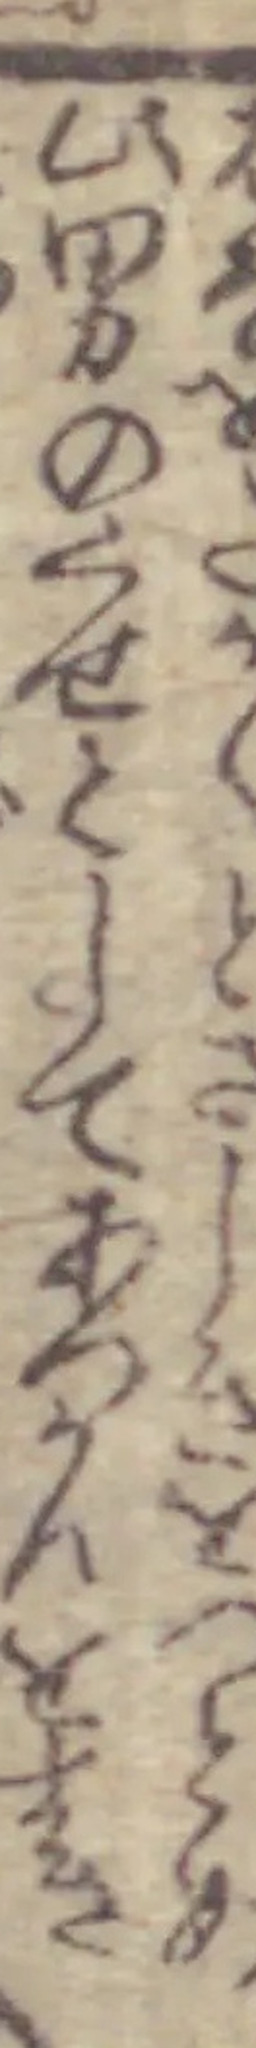此男のくせとしてあつかんをすき
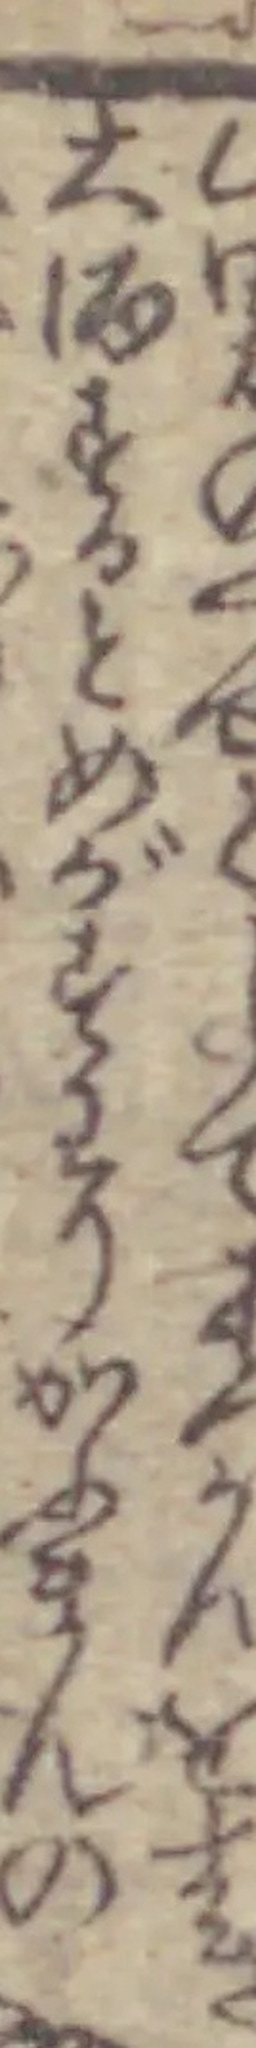大酒するとめがすわりかふまんの
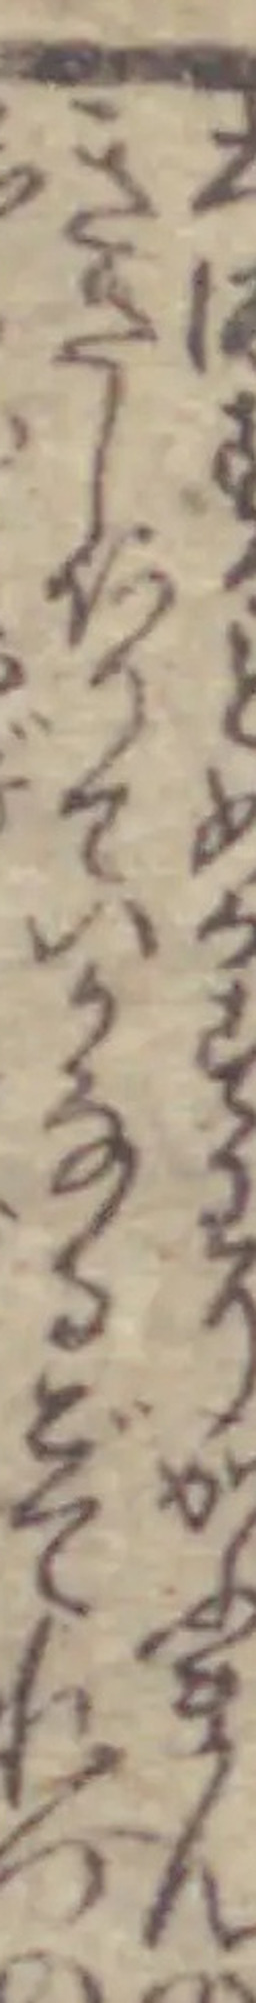きさしありていかなるごてれつの
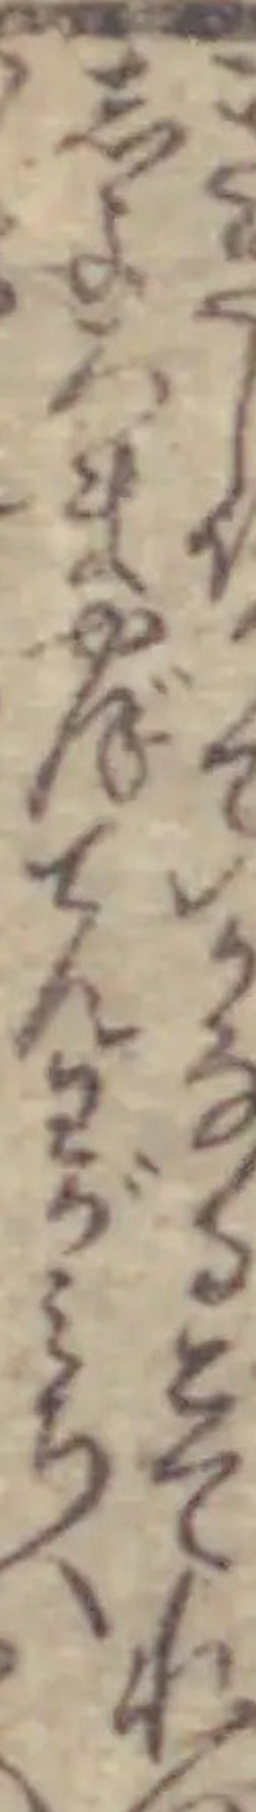しよろまやぼてんわがみちへ
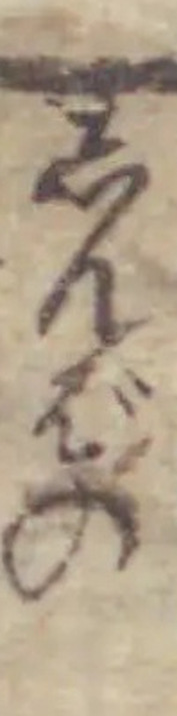しんばの
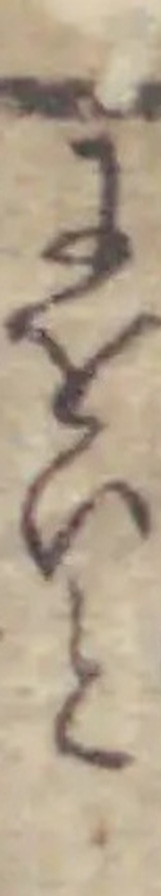にをいと
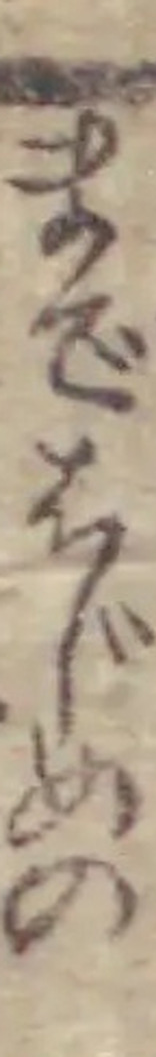まではじめの
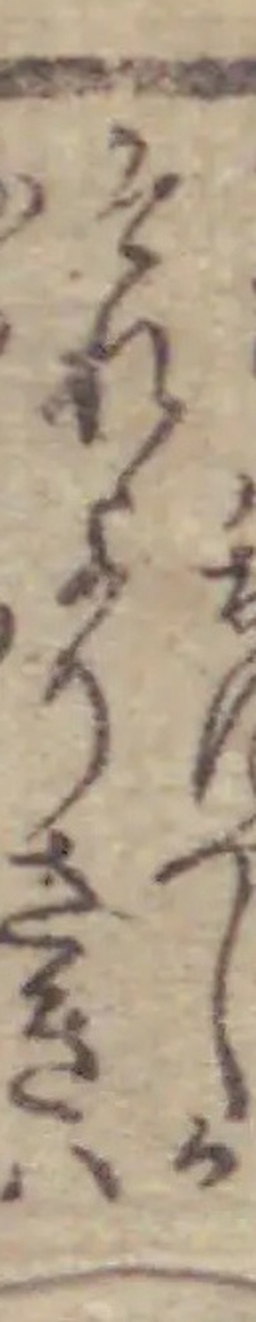それよりさきは
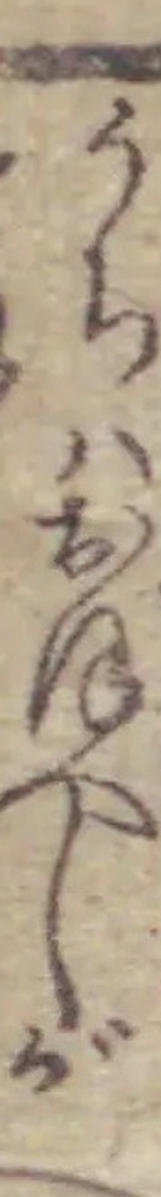うちはおほへしが
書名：珍説女天狗 2巻
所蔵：国立国会図書館 National Diet Library, JAPAN
